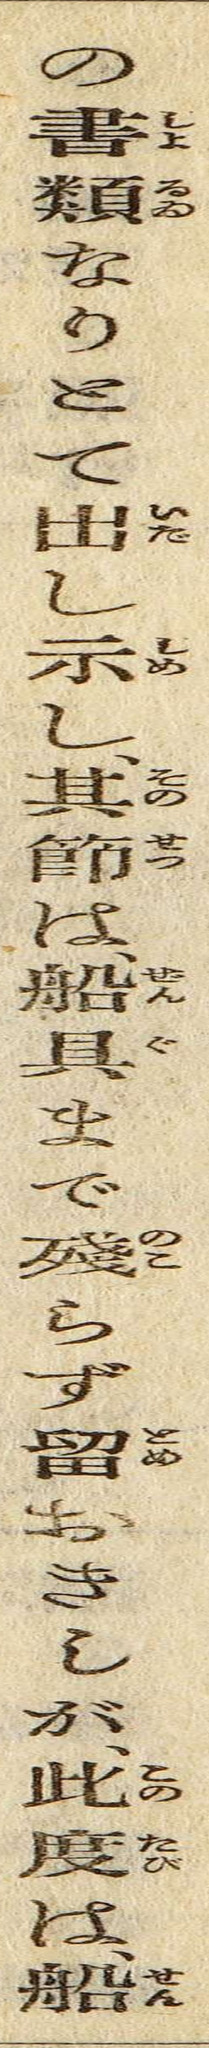の書類なりとて出し示し其節は船具まで残らず留おきしが此度は船
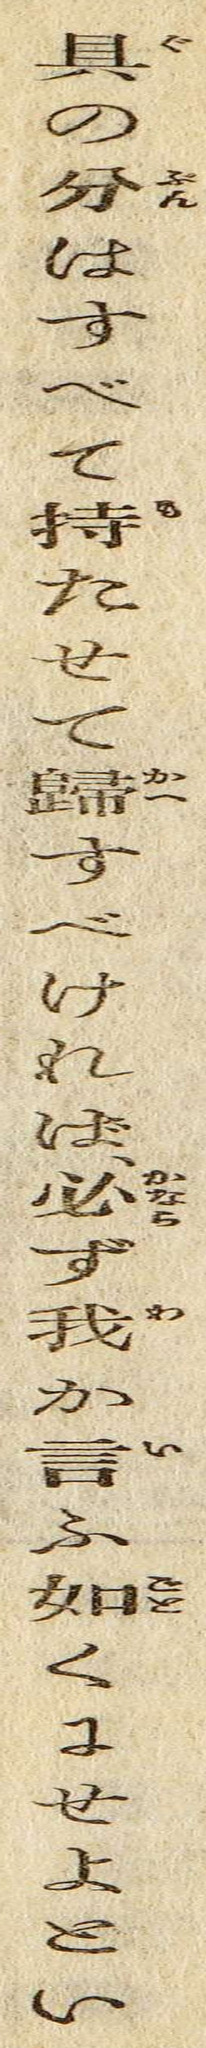具の分はすべて持たせて帰すべければ必ず我か言ふ如くにせよとい
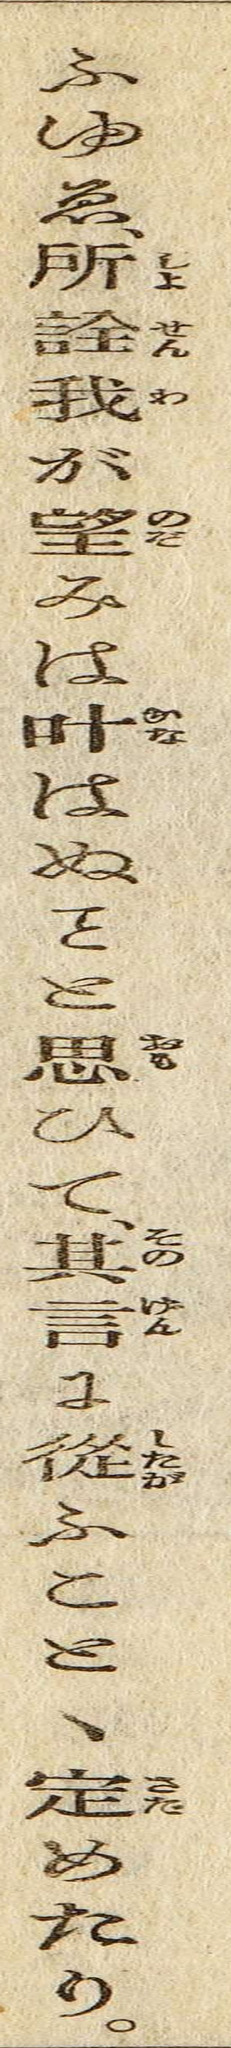ふゆゑ所詮我が望みは叶はぬことと思ひて其言に従ふことゝ定めたり。
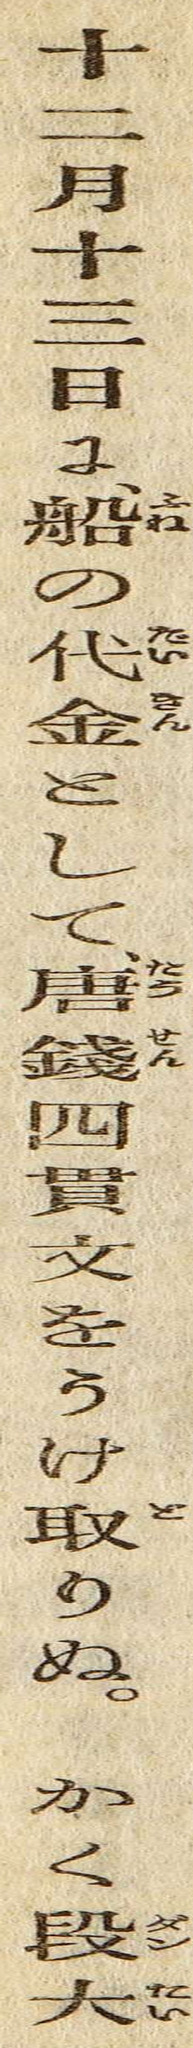十二月十三日に船の代金として唐銭四貫文をうけ取りぬ。かく段大
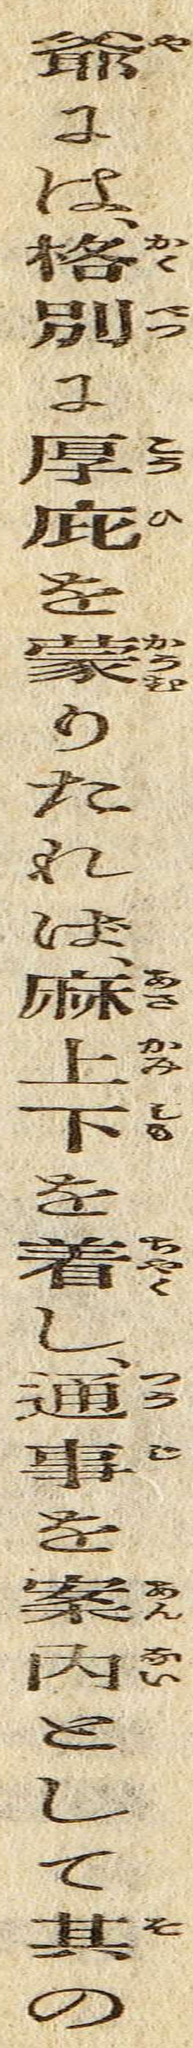爺には格別に厚庇を蒙りたれば麻上下を着し通事を案内として其の
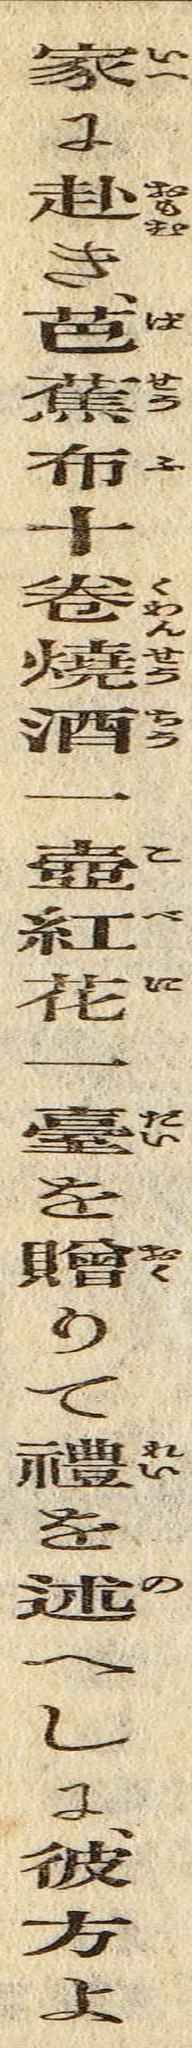家に赴き芭蕉布十巻焼酎一壺紅花一台を贈りて礼を述へしに彼方よ
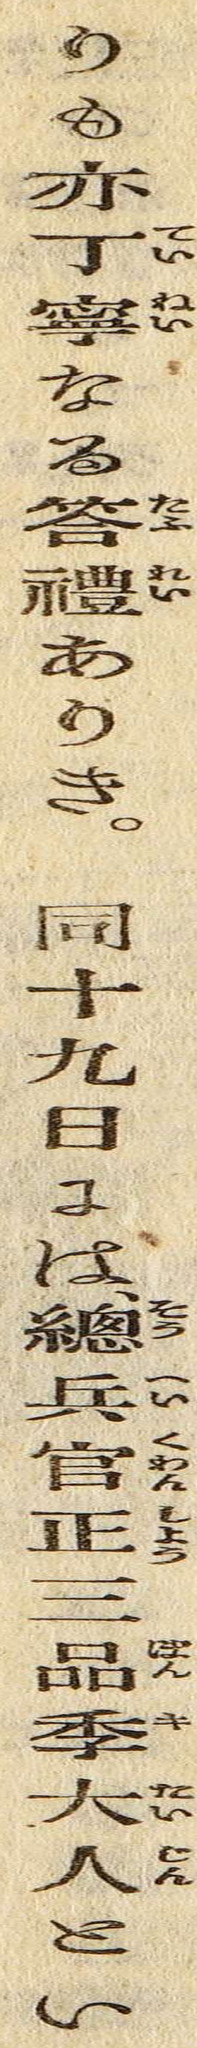りも亦丁寧なる答礼ありき。同十九日には総兵官正三品季大人とい
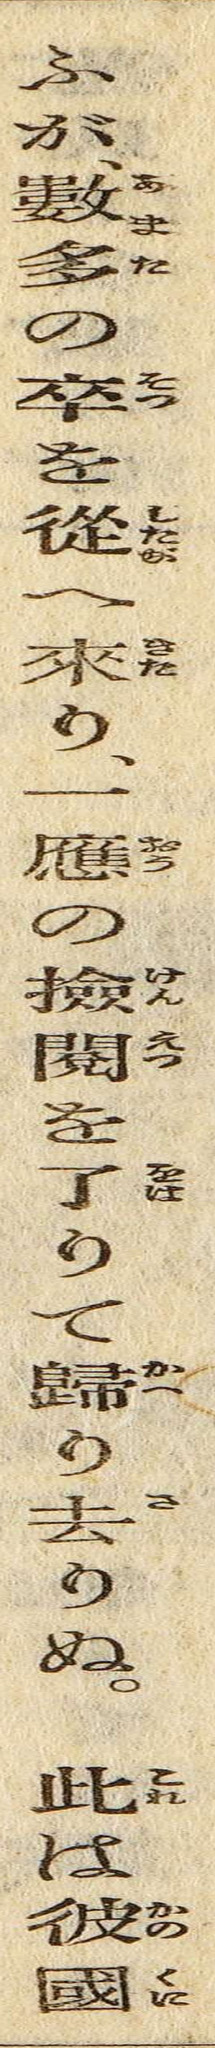ふが数多の卒を従へ來り、一応の検閲を了りて帰り去りぬ。此は彼国
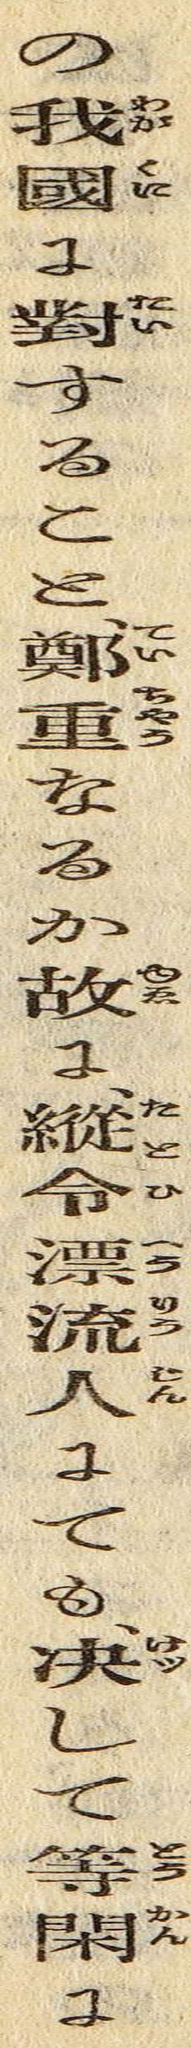の我国に対すること鄭重なるか故に、縦令漂流人にても決して等閑に
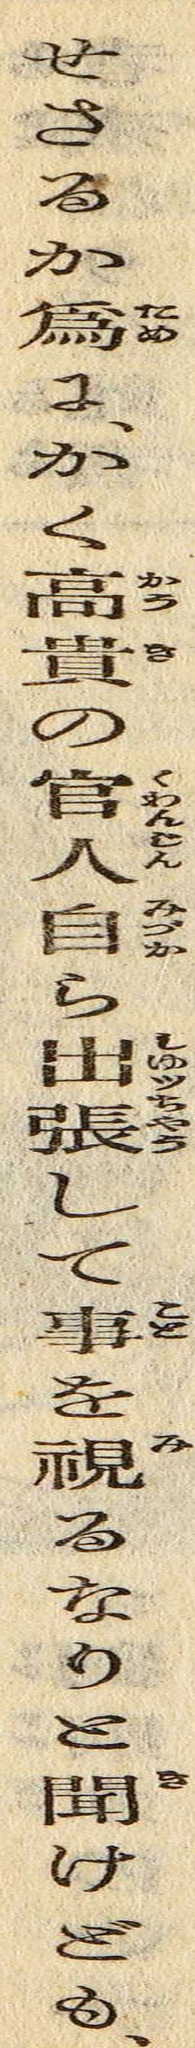せさるか為にかく高貴の官人自ら出張して事を視るなりと聞けども、
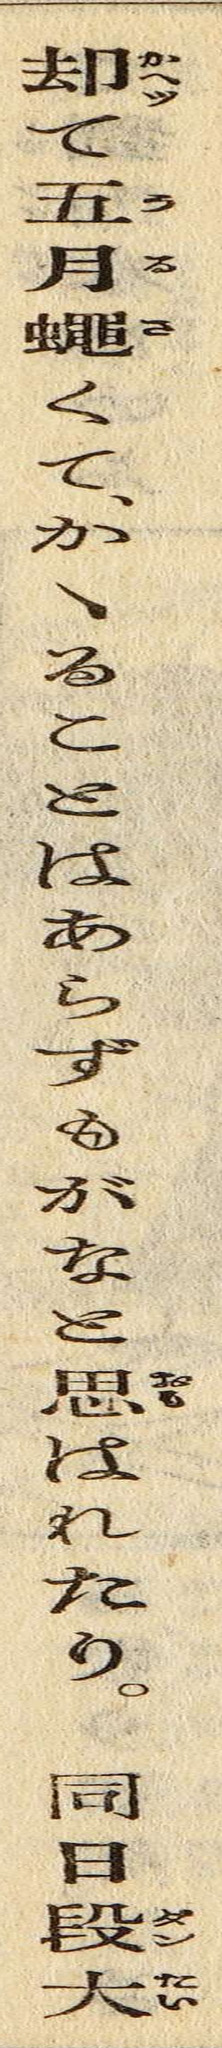却て五月蝿くてかヽることはあらずもがなと思はれたり。同日段大
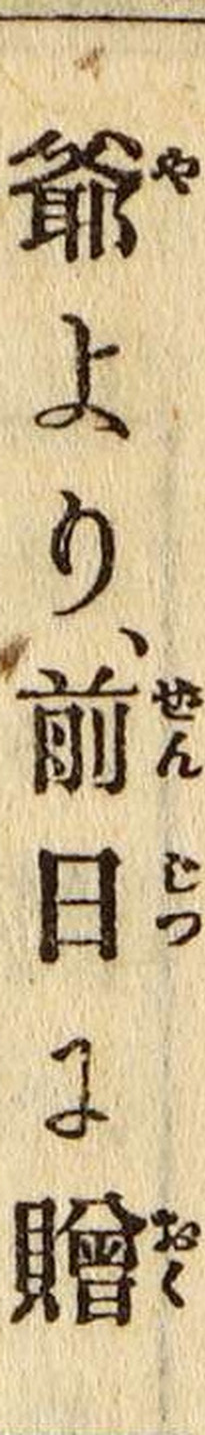爺より前日に贈
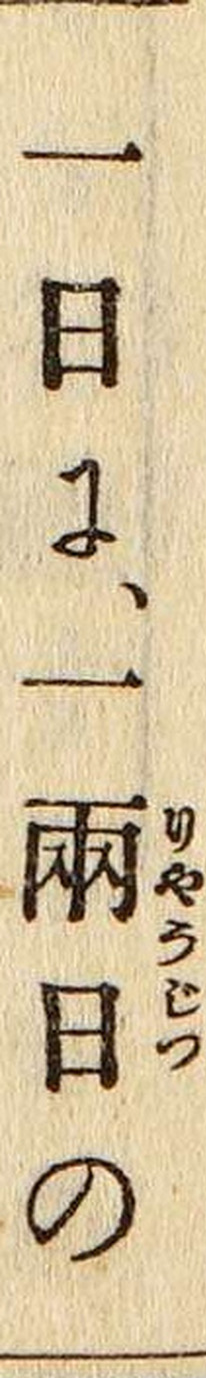一日に、一両日の
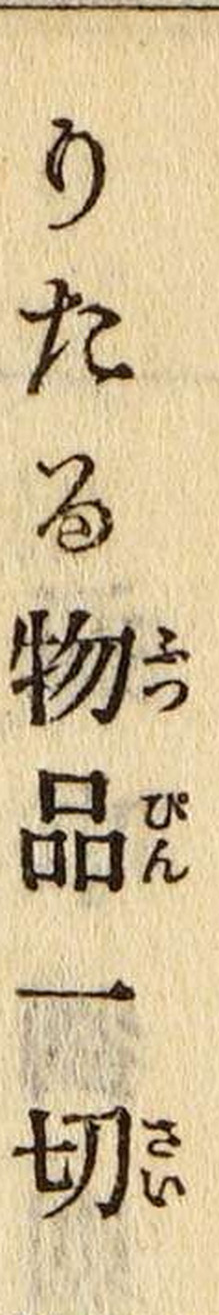りたる物品一切
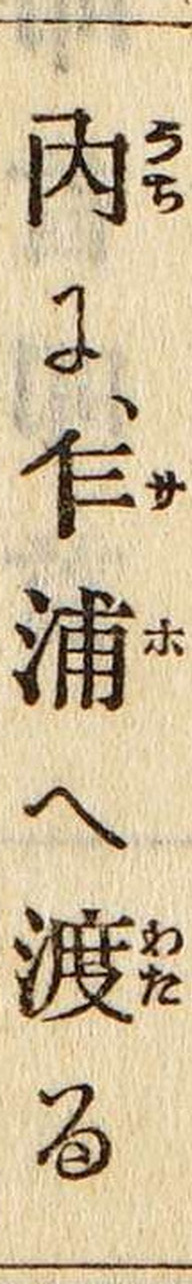内に乍浦へ渡る
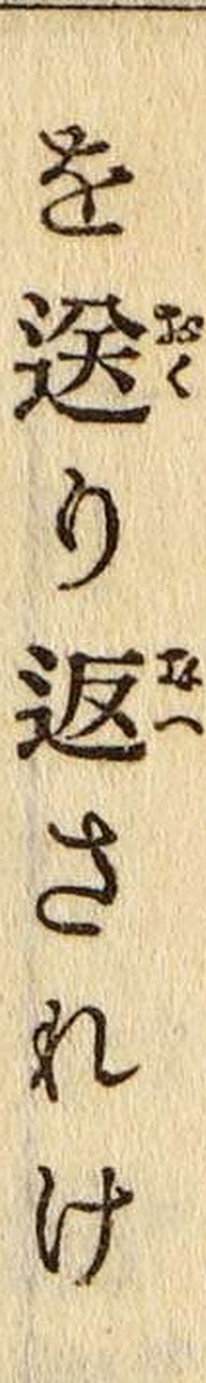を送り返されけ
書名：日本漂流譚
